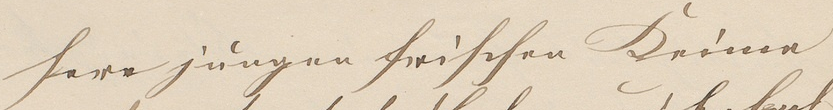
sern jungen frischen Keime
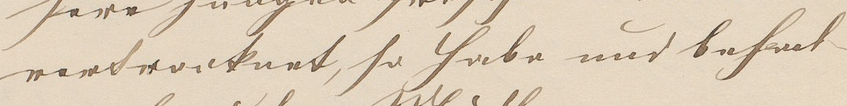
vertrocknet, so habe und behal-
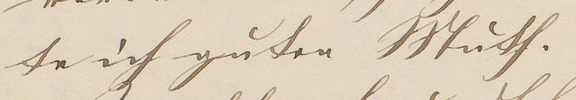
te ich guten Muth.
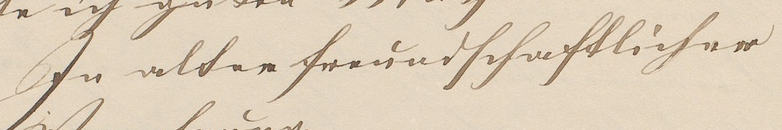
In alter freundschaftlicher
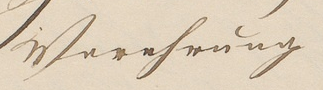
Verehrung
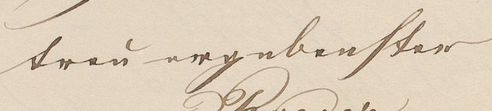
treu ergebenster
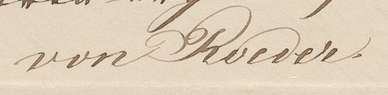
von Roeder.
